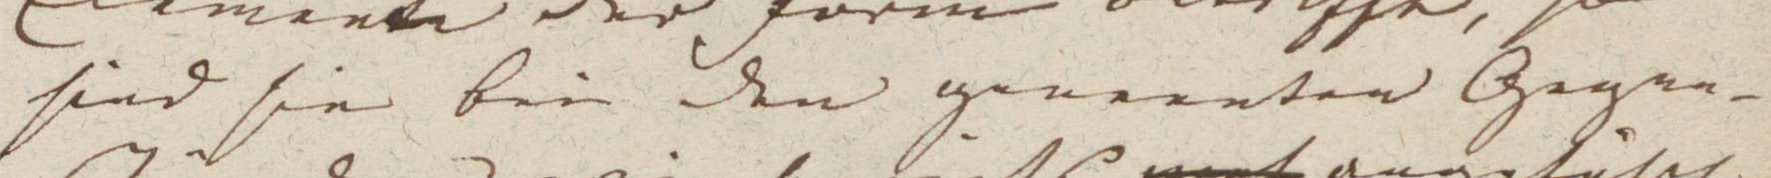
sind sie bei den genannten Gegen-
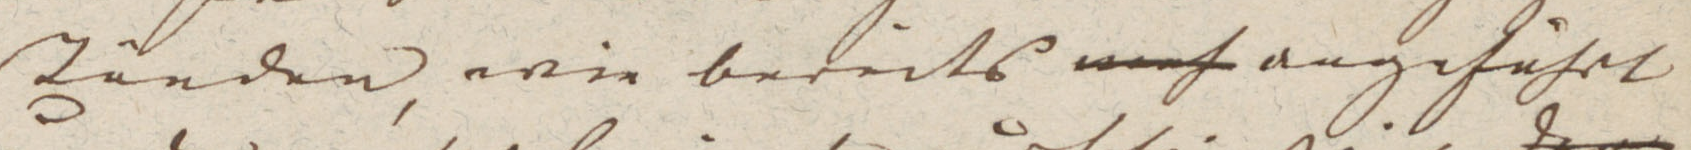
ständen, wie bereits nach angeführt
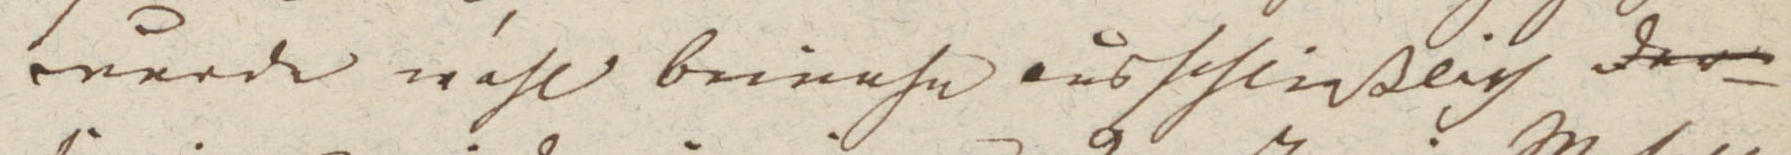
wurde wohl beinahe ausschliesslich der-
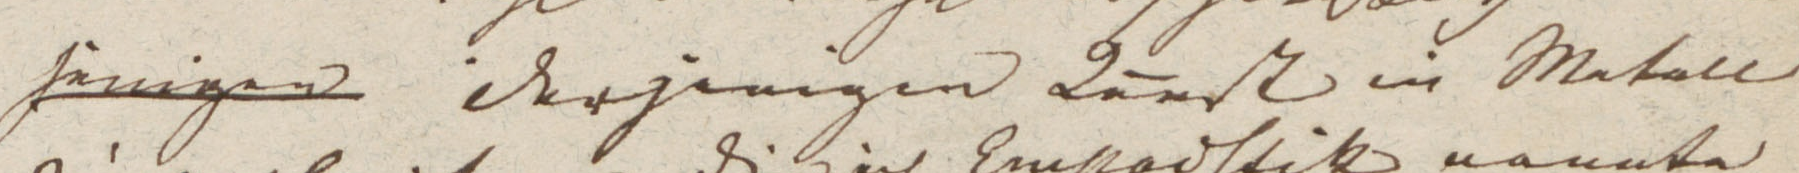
jenigen derjenigen Kunst in Metall
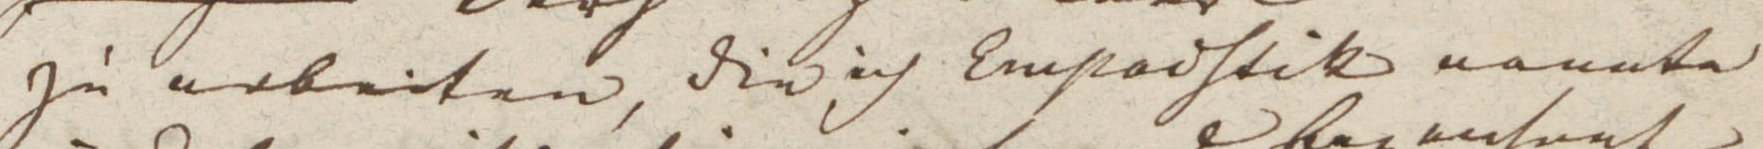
zu arbeiten, die ich Empaistik nannte
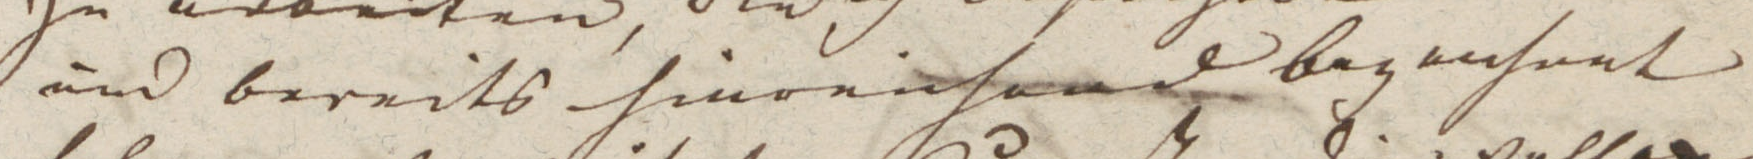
und bereits hinreichend bezeichnet
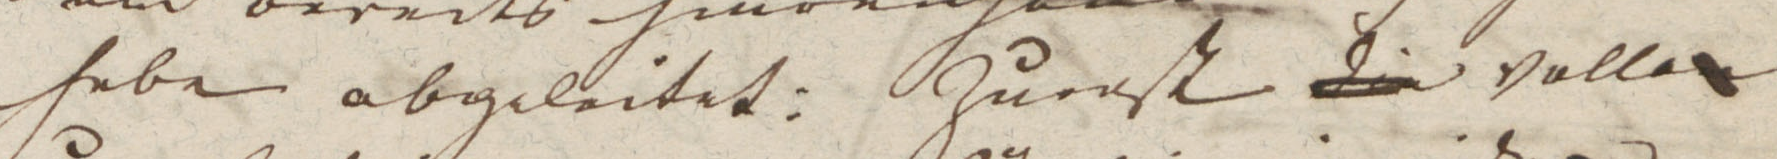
habe abgeleitet: Zuerst die vollen
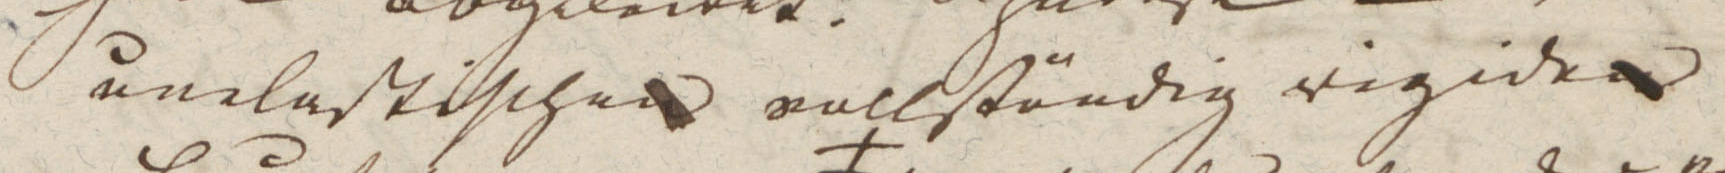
unelastischen vollständig rigiden
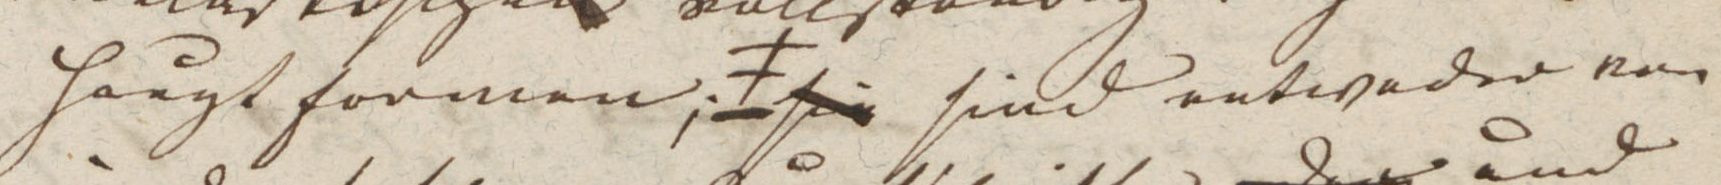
Hauptformen; % sie sind entweder von
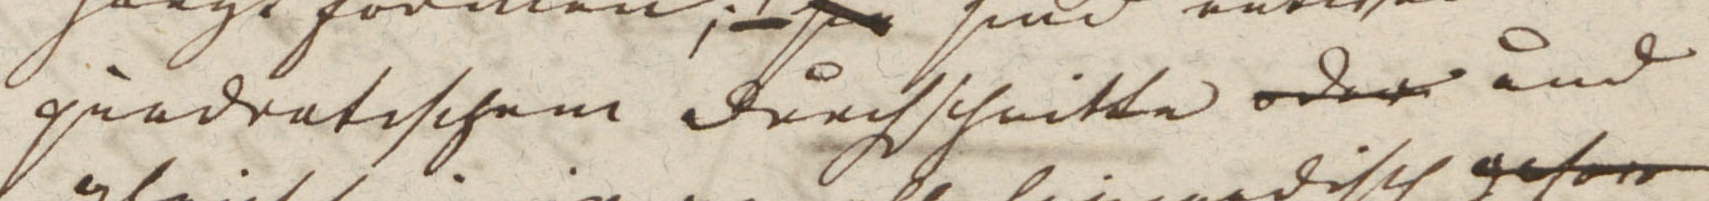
quadratischem Durchschnitte oder und
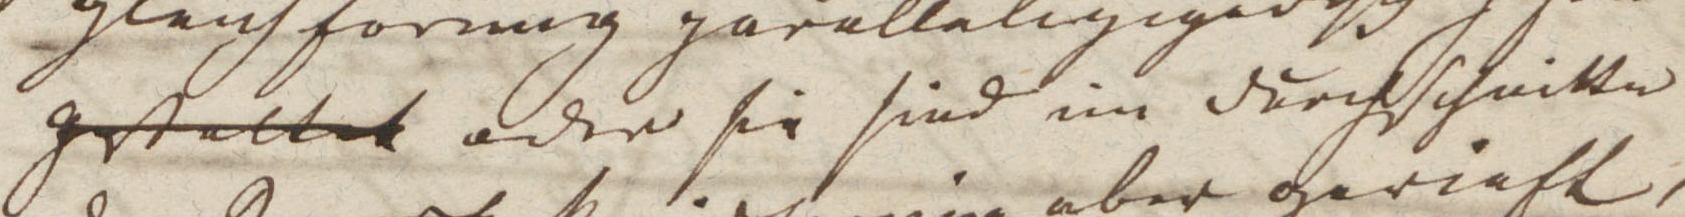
gestaltet oder sie sind im Durchschnitte
